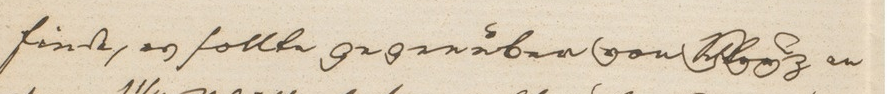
finde, es sollte gegenüber von Schwyz an
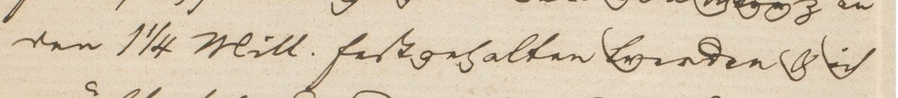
den 1¼ Mill. festgehalten werden & ich
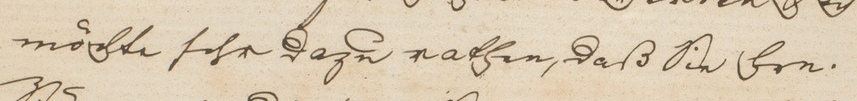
möchte sehr dazu rathen, daß Sie Hrn.
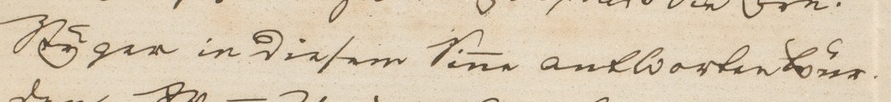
Styger in diesem Sinne antworten wür-
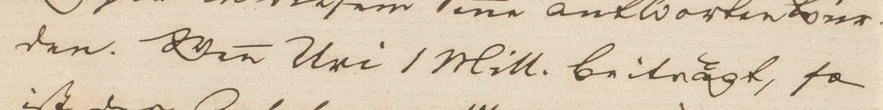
den. Wenn Uri 1 Mill. beiträgt, so
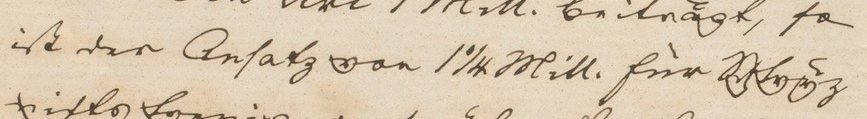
ist der Ansatz von 1¼ Mill. für Schwyz
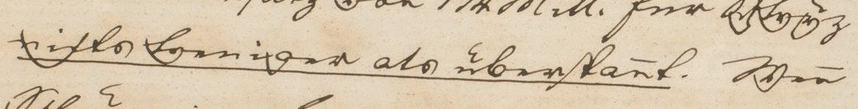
nichts weniger als überspannt. Wenn
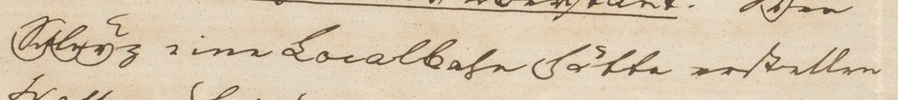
Schwyz eine Localbahn hätte erstellen
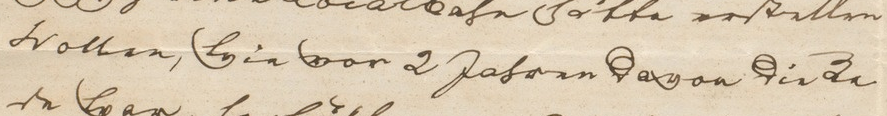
wollen, wie vor 2 Jahren davon die Re-
